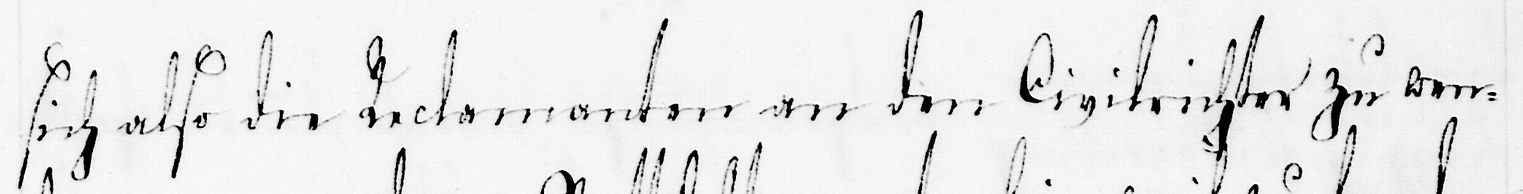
sich also die Reclamanten an den Civilrichter zu wen¬
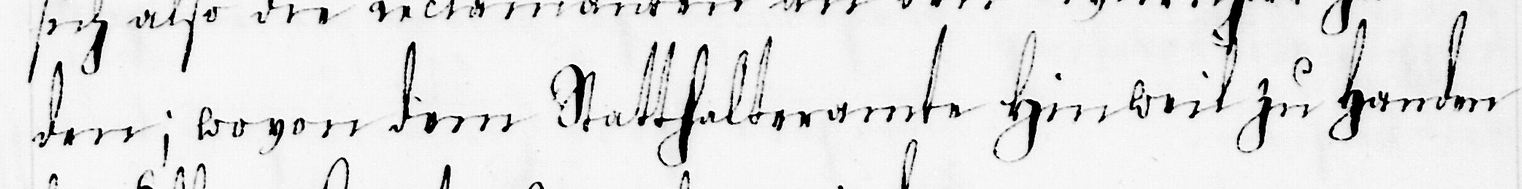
den; wovon dem Statthalteramte Hinweil zu Handen
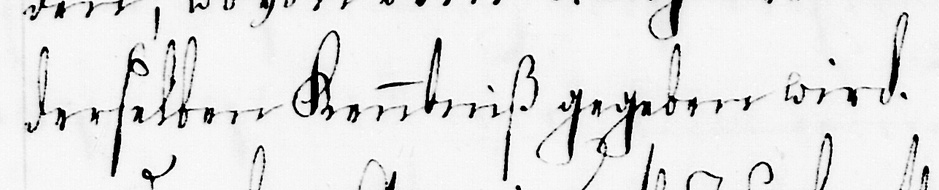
derselben Kenntniß gegeben wird.
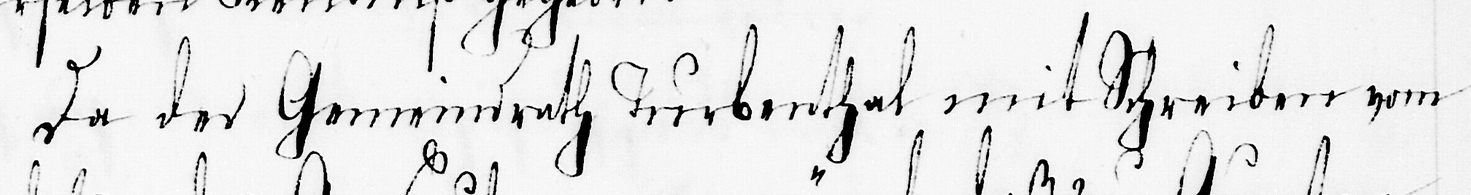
Da der Gemeindrath Turbenthal mit Schreiben vom
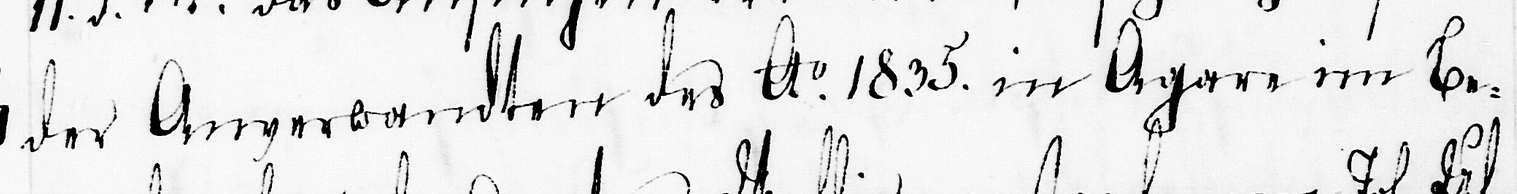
der Anverwandten des Ao. 1835. in Agare im Be¬
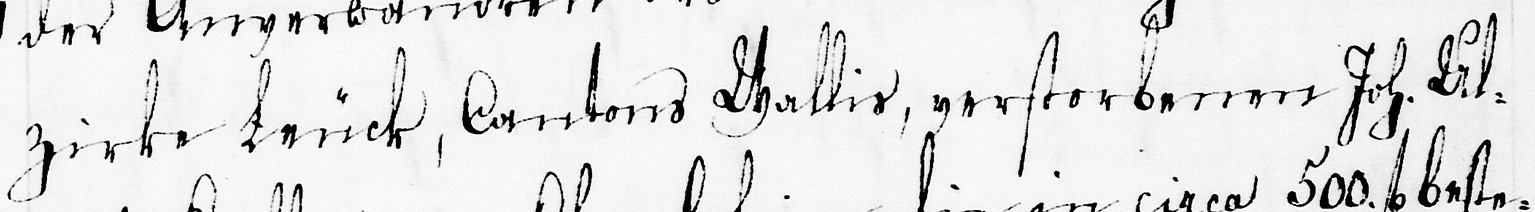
zirke Leuck, Cantons Wallis, verstorbenen Joh. Ul¬
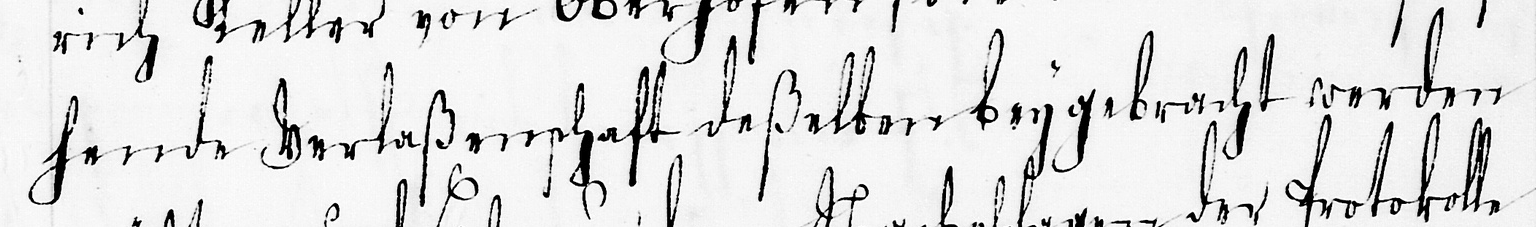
ehende Verlaßenschaft deßelben beygebracht werden
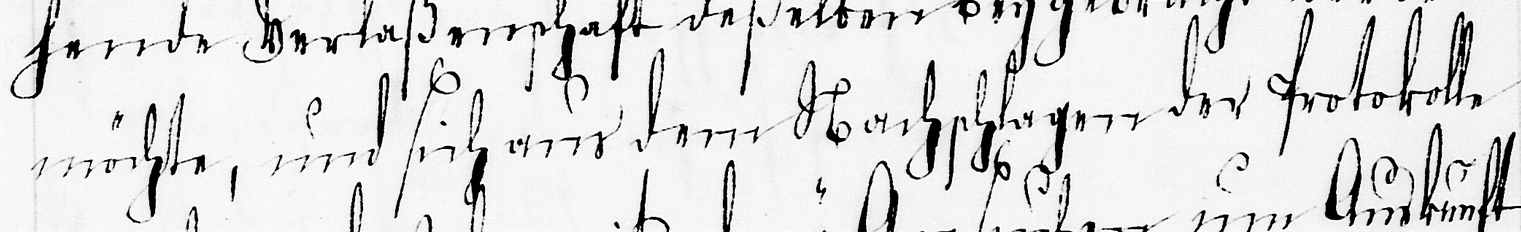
möchte, und sich aus dem Nachschlagen der Protokol¬
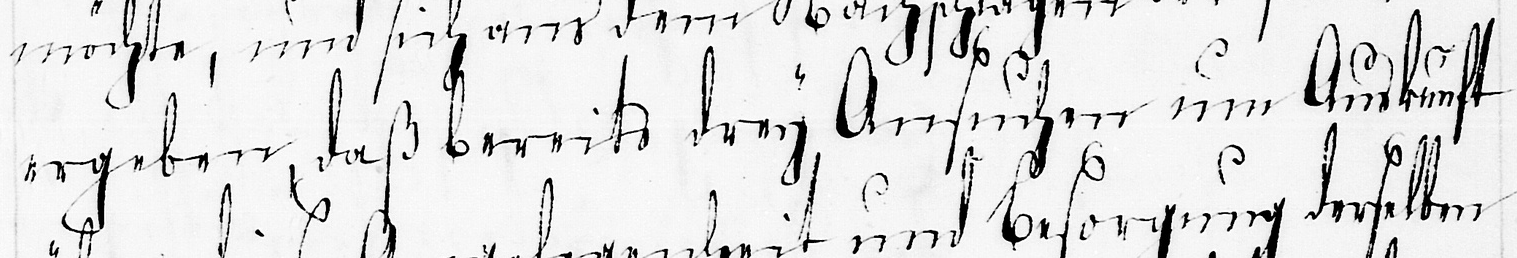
ergeben, daß bereits drey Ansuchen um Auskunft
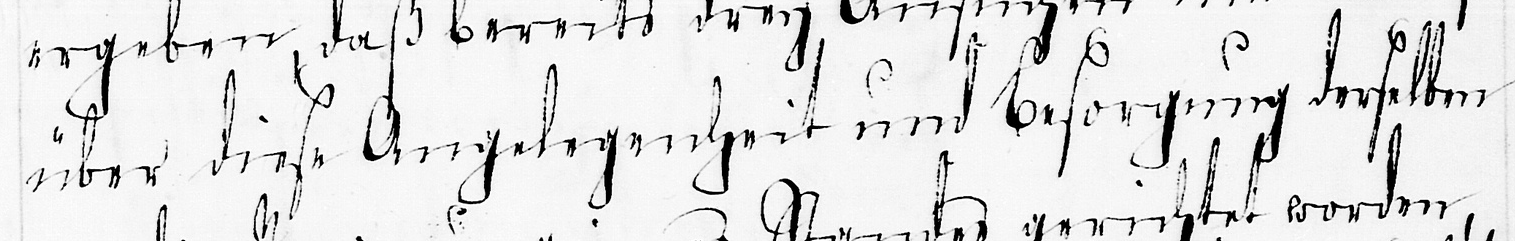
über diese Angelegenheit und Besorgung derselben
